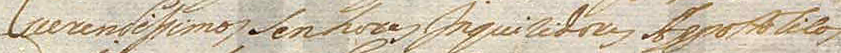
uerendissimos senhores Jnquizidores Appostolicos
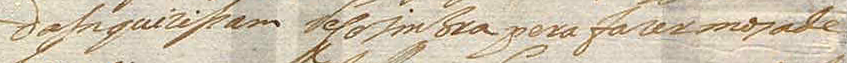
da Jnquizissam de Coimbra pera fazermos a de
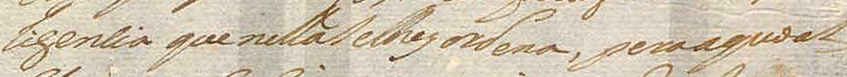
ligencia que nella se lhes ordena, pera a quoal
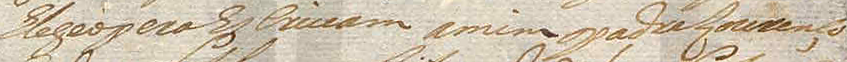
Elegeo pera Ezcriuam a mim o padre Lourenço
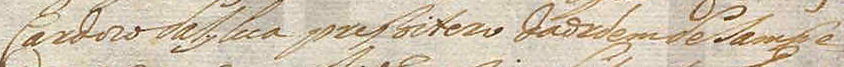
Cardozo da Silua presbitero da ordem de Sam pe
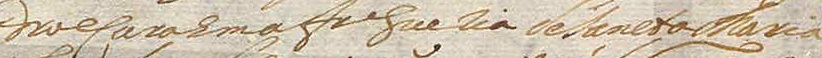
dro e Cura Em a freguezia de Sancta Maria
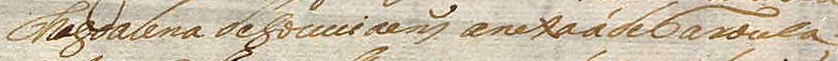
Magdalena de Gouuiaen̄s anexa á de Tarouca;
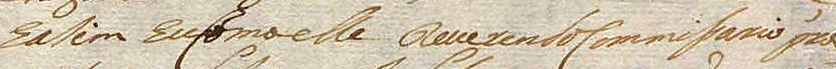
E asim Eu Como elle Reuerendo Commissario pro
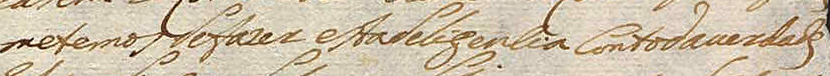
metemos de fazer esta deligencia Con toda uerdade
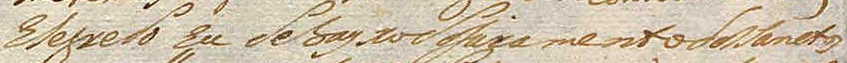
E segredo Eu debayxo do juramento dos sanctos
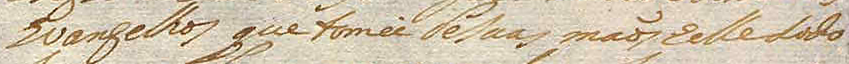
Evangelhos que tomei de suas maos E elle sob o
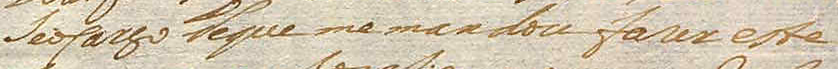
seo Cargo de que me mandou fazer este
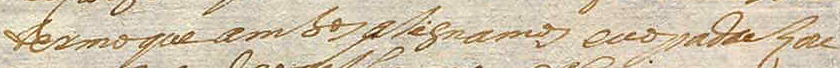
termo que ambos asignamos eu o padre Lou
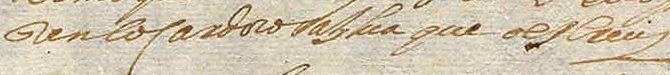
renco Cardozo da Sylva que o escreuj
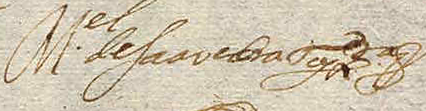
M.el de Saavedra Teyx.ra
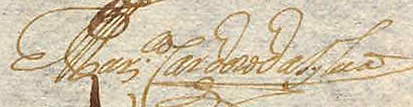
Lor.co Cardozo da Sylua
